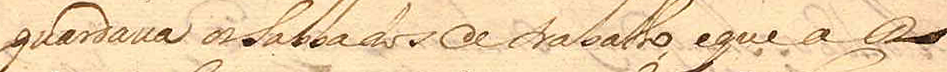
guardaua os Sabbados de trabalho, e que as
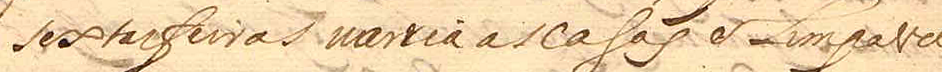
sextas feiras uarria as casas e Limpava
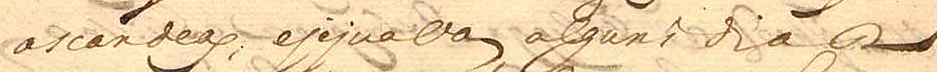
as candeas, e jejuava alguns dias
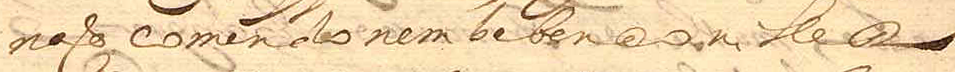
naõ comendo nem bebendo nelles
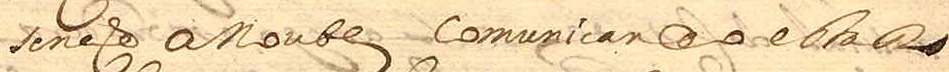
senaõ a noute comunicando estas
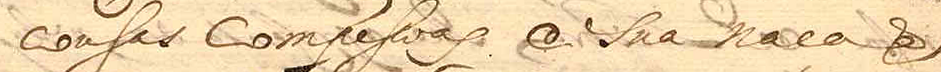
cousas com pessoas de sua naçaõ
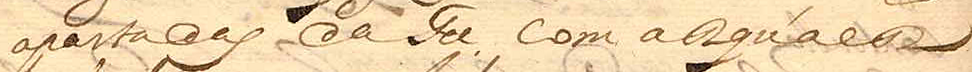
apartadas da Fee com as quaes
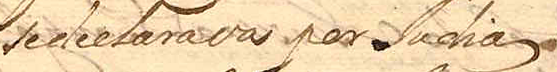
se declarava por Iudia
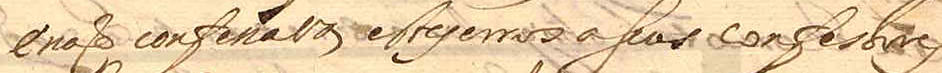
E naõ confessava estes erros a seus confessores
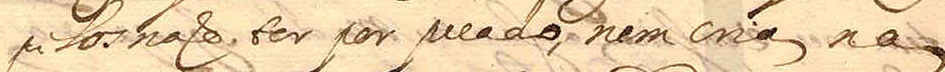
pelos naõ ter por pecado, nem cria na
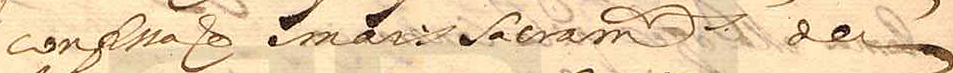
confessaõ e mais sacramtos. da
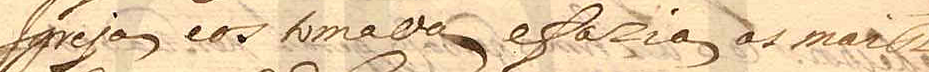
Jgreja e os tomava e fazia as mais
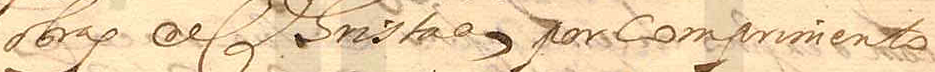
obras de Chistaa por comprimento
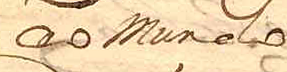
ao mundo
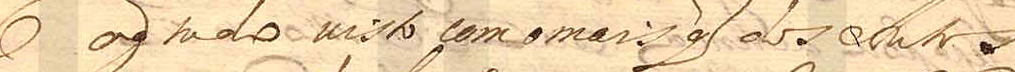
o q̅ tudo uisto com o mais q̅ dos Autos
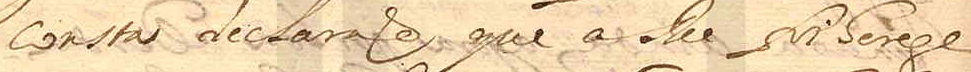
consta declarãaõque a Ree foi herege
